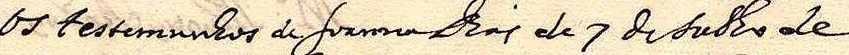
os testemunhos de Joanna Dias de 7 de Iulho de
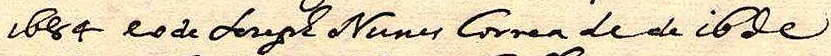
1684 e o de Iozeph Nunes Correa de de i6 de
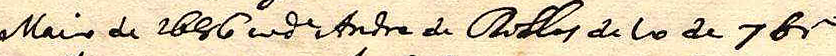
Maio de 1686 e o de Andre de Robles de 10 de 7bro
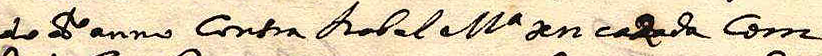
do d̄o anno Contra Izabel Ma xn caZada Com
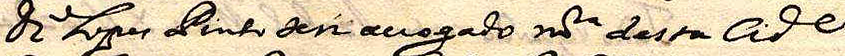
Dio Lopes Pinto xn auogado mora desta Cide
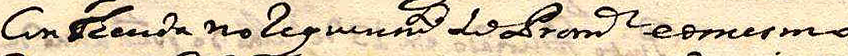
Contheuda no Requerimto do Promor e o mesmo
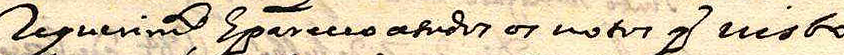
Requerimto, E pareceo a todos os uotos q̄ uisto
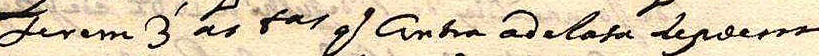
serem 3 as tas q̄ Contra a delata depoem
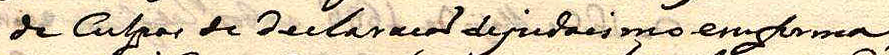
de Culpas de declaraçaõ de judaismo em forma
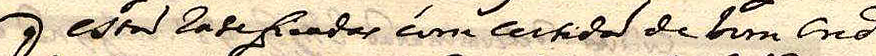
q̄ estaõ Rateficadas com certidaõ de bom credo
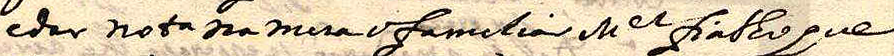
e dar nota na mesa o fameliar Mel fialho que
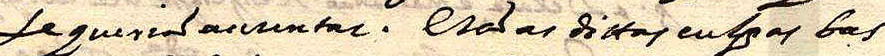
se queriaõ auzentar. E saõ as dittas culpas bas
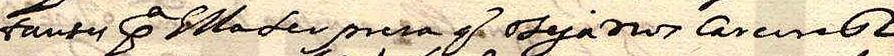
tantes pa Ella ser presa, q̄ o seja nos carceres
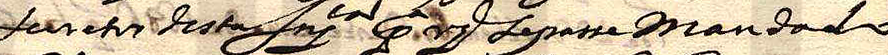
secretos desta Jnqcaõ pa o q̄ se passe mandado
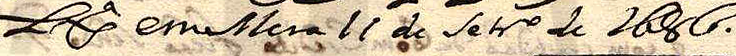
Lxa em Mesa 11 de setro de 1686.
